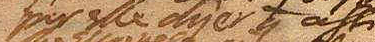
por Elle dizer q̄ assi
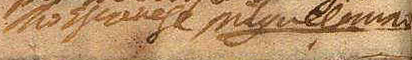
lho Escreuese Miguel nuno
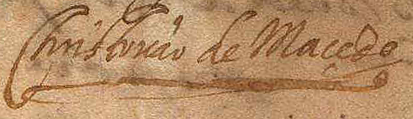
Christouão de Macedo
